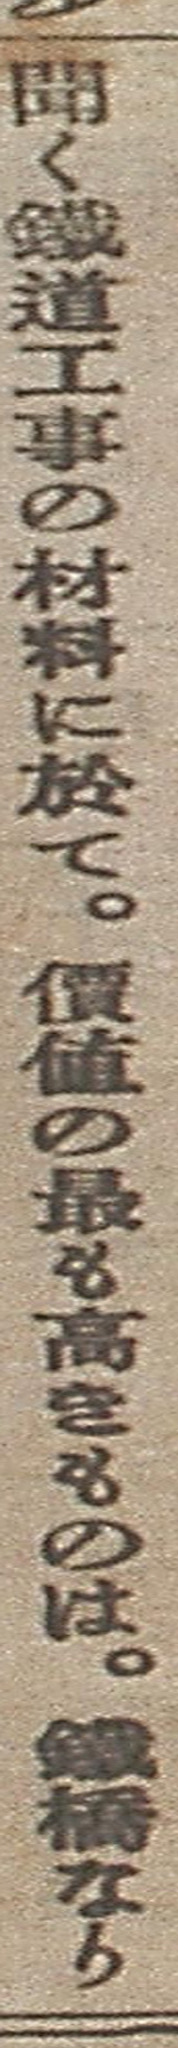聞く鉄道工事の材料に於て。価値の最も高きものは。鉄橋なり
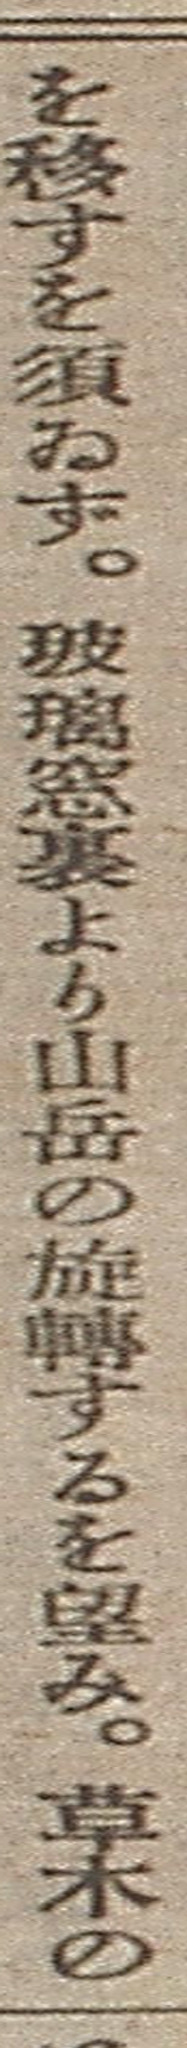を移すを須ゐず。玻璃窓裏より山岳の旋転するを望み。草木の
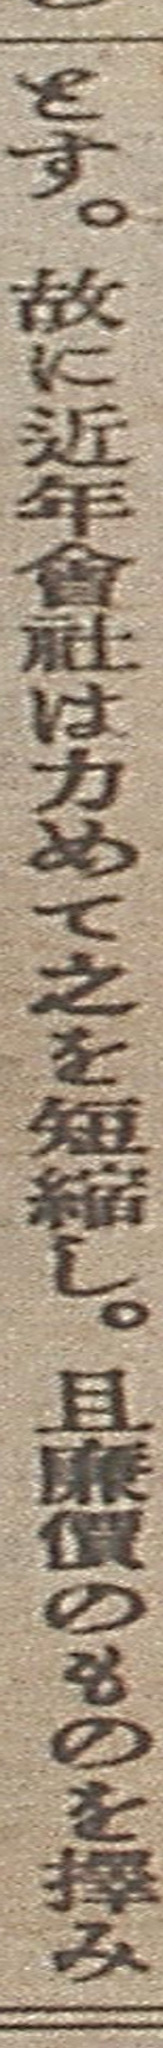とす。故に近年会社は力めて之を短縮し。且廉価のものを択み
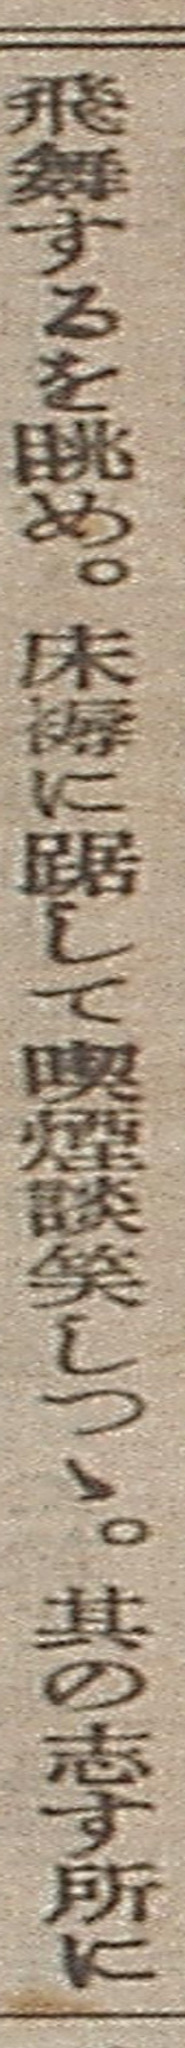飛舞するを眺め。床褥に踞して喫煙談笑しつゝ。其の志す所に
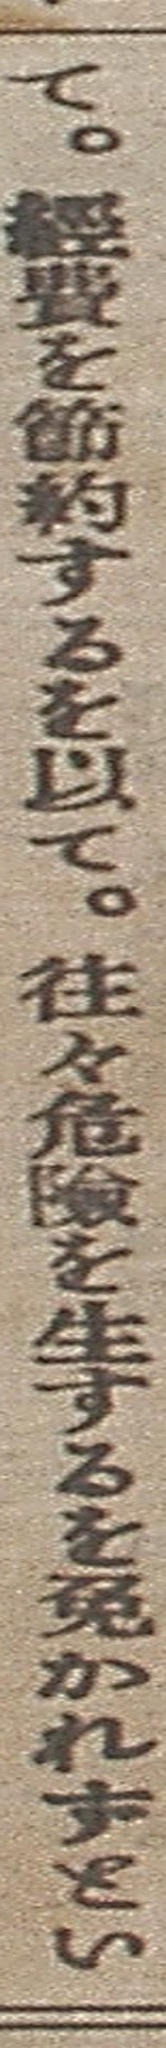て。経費を節約するを以て。往々危険を生するを免かれずとい
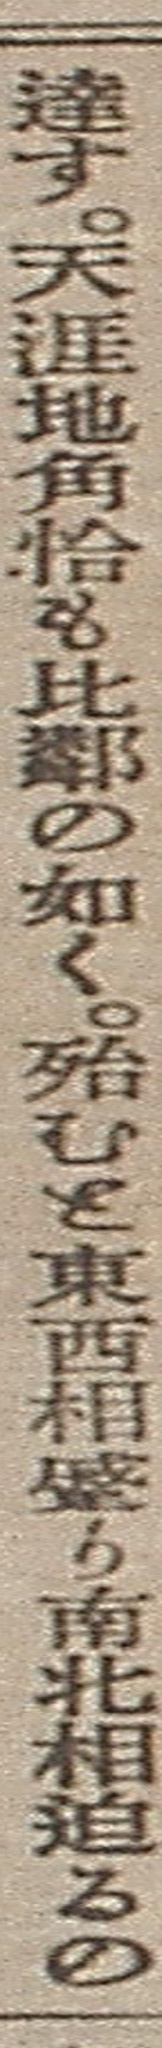達す。天涯地角恰も比鄰の如く。殆むと東西相蹙り南北相迫るの
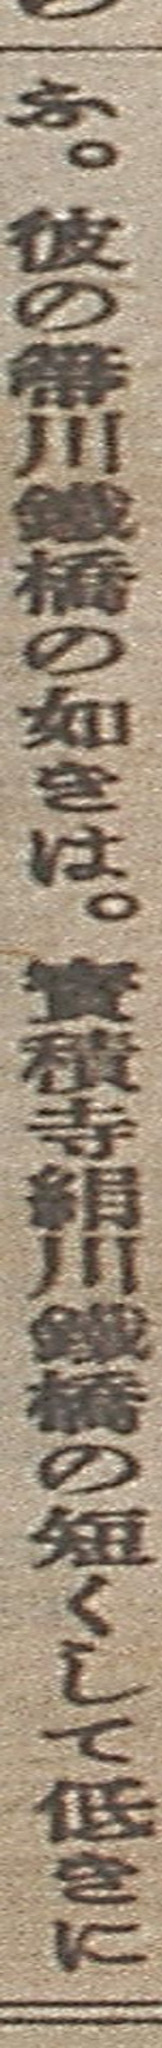ふ。彼の箒川鉄橋の如きは。寶積寺絹川鉄橋の短くして低きに
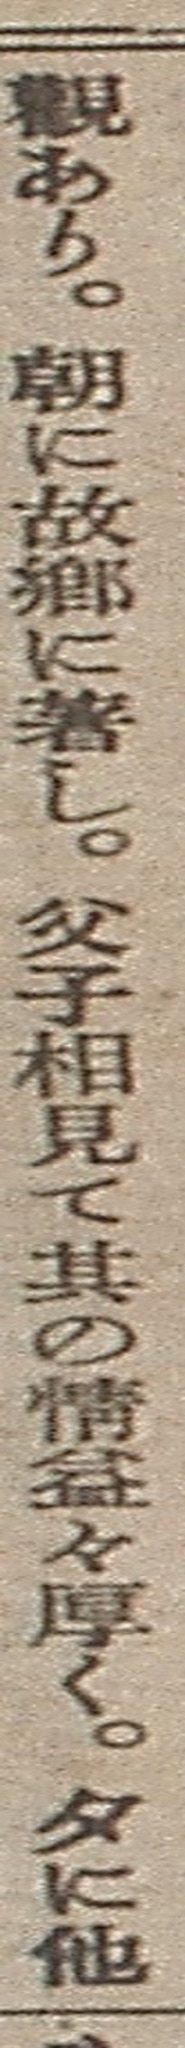観あり。朝に故郷に著し。父子相見て其の情益々厚く。夕に他
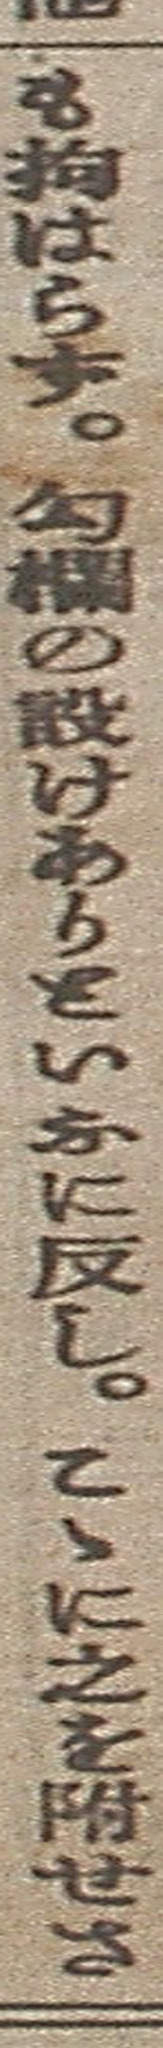も拘はらず。勾欄の設けありといふに反し。こゝに之を附せさ
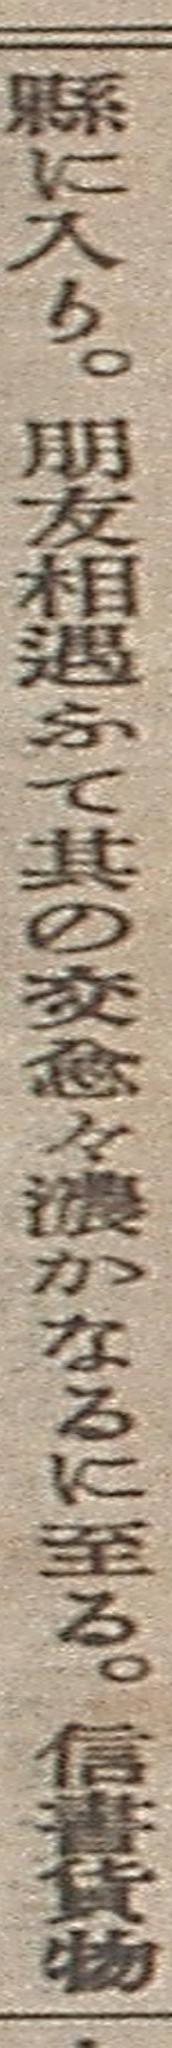県に入り。朋友相遇ふて其の交愈々濃かなるに至る。信書貨物
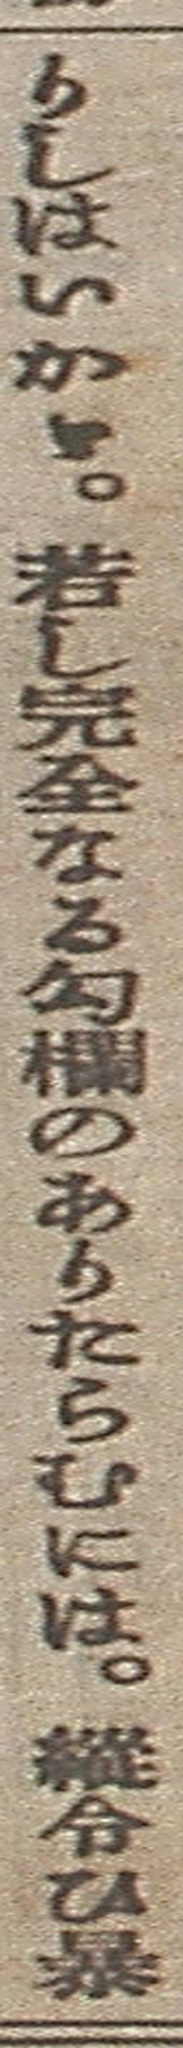りしはいかゞ。若し完全なる勾欄のありたらむには。縦令ひ暴
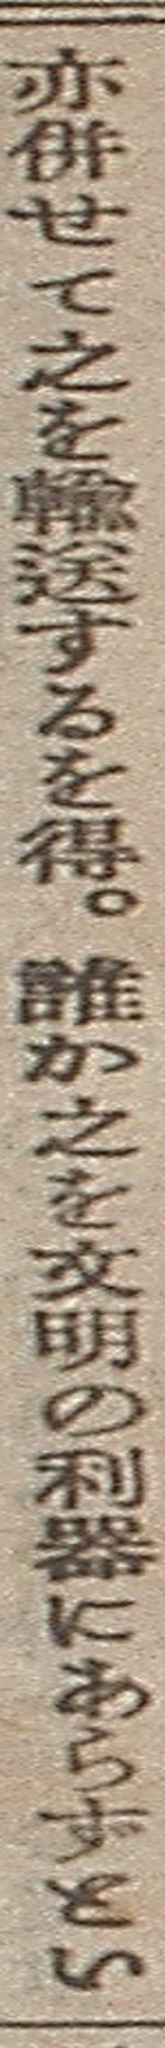亦併せて之を輸送するを得。誰か之を文明の利器にあらずとい
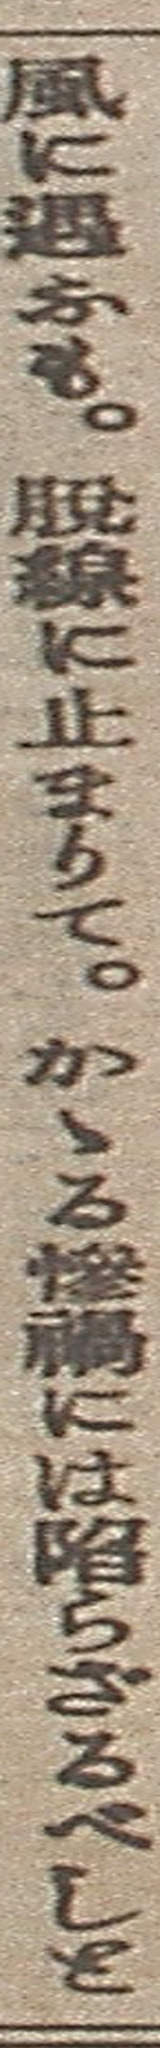風に遇ふも。脱線に止まりて。かゝる惨禍には陥らざるべしと
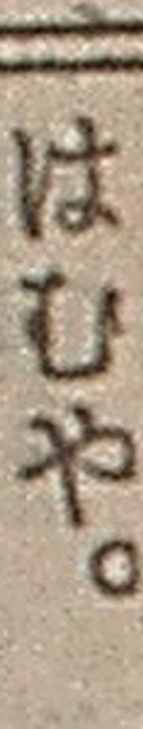はむや。
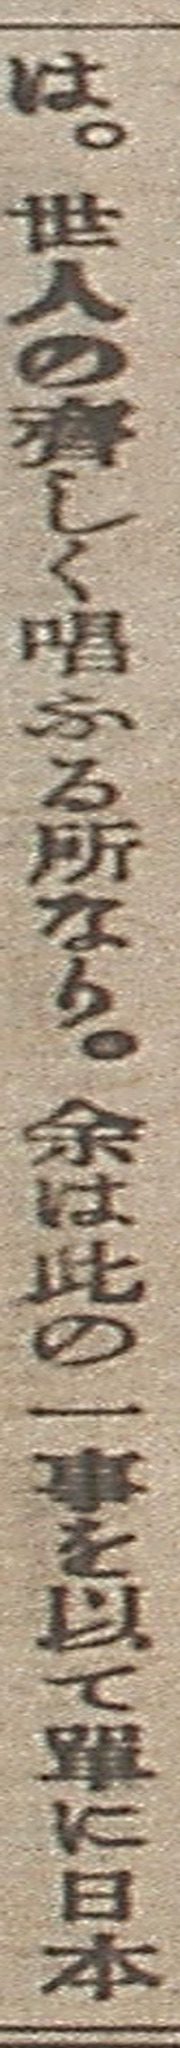は。世人の斉しく唱ふる所なり。余は此の一事を以て単に日本
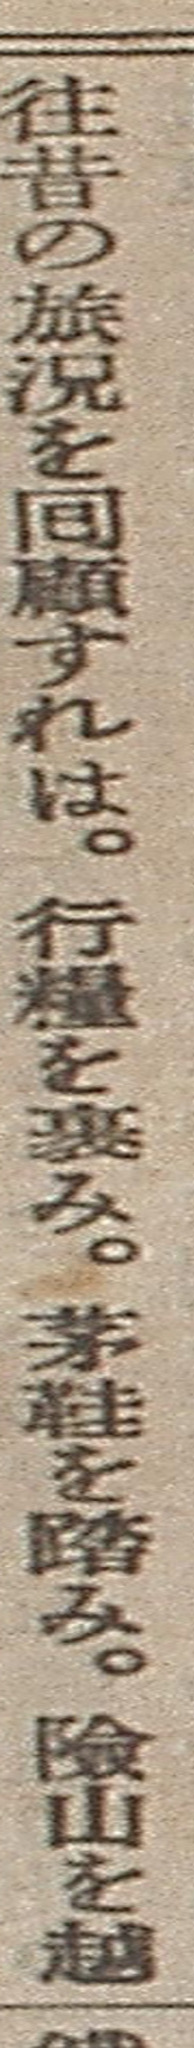往昔の旅況を回顧すれは。行糧を裹み。茅鞋を踏み。嶮山を越
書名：風俗畫報臨時増刊第百九十九號　明治三十二年十月各地災害圖會（前編之續）
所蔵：東京大学地震研究所図書室 Earthquake Research Institute Library, The University of Tokyo, JAPAN
